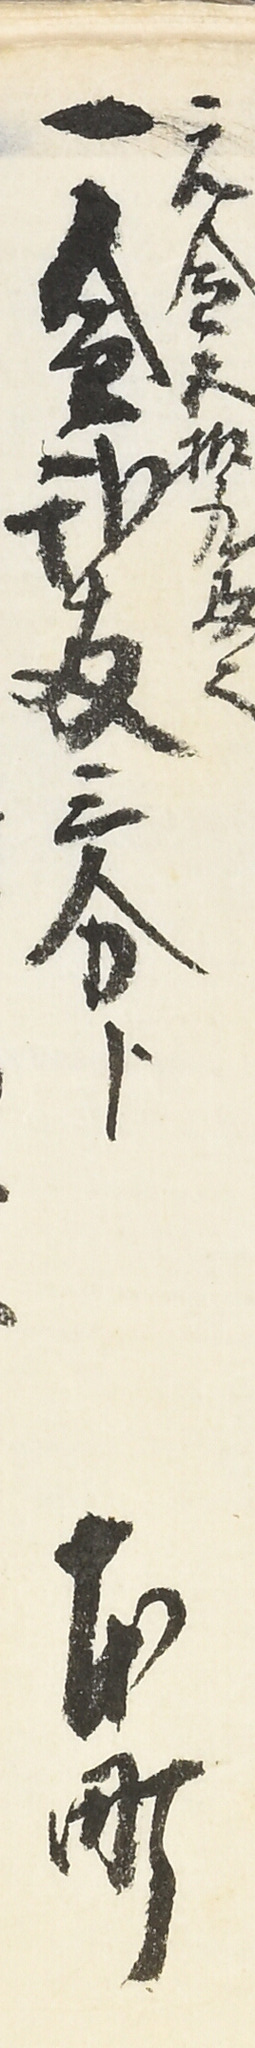一金弐両三分ト本町
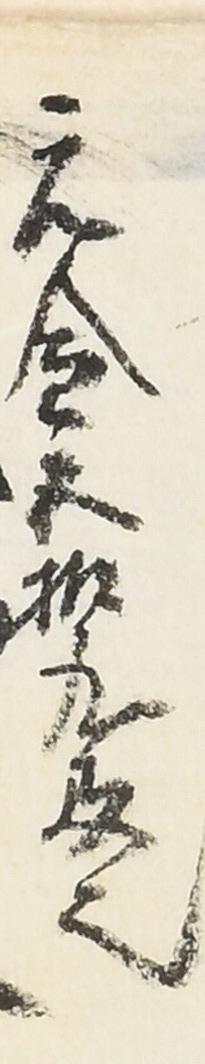元金五拾九両也
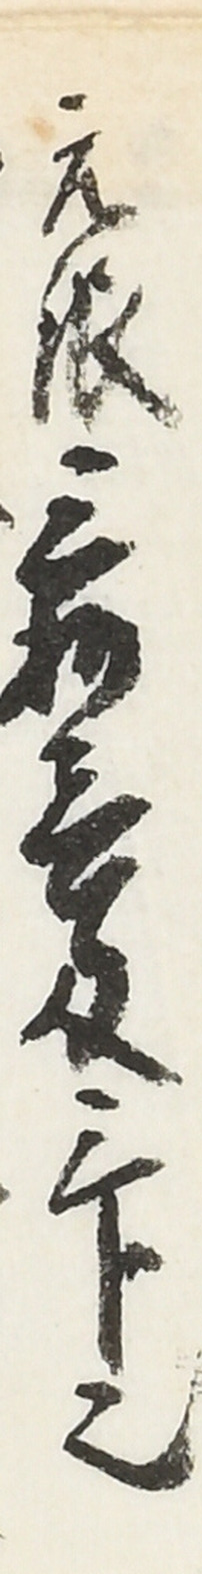元銀三拾三匁三分也
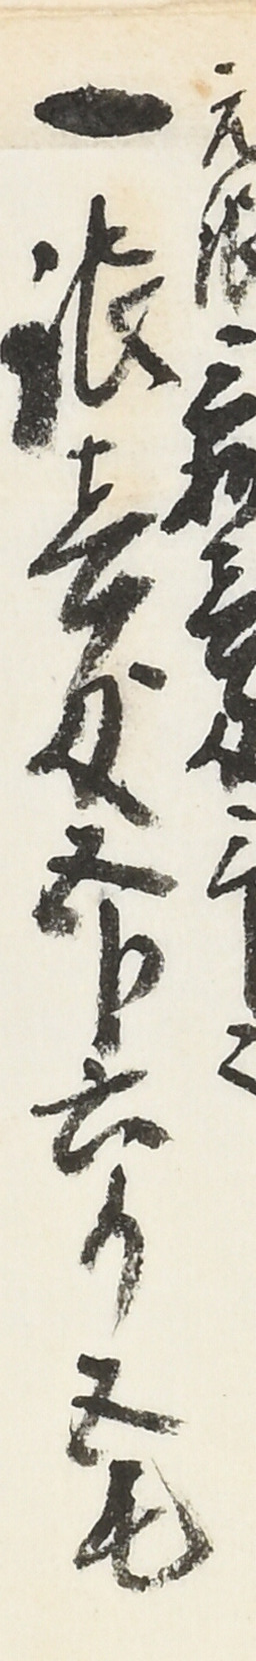一銀壱匁五分六厘五毛
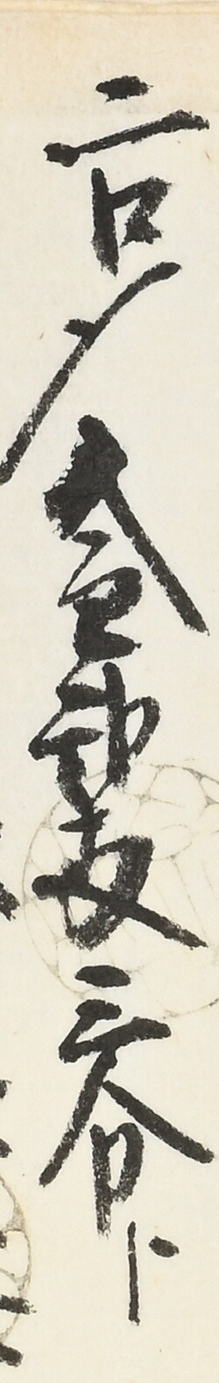ニ口〆金弐匁三分ト
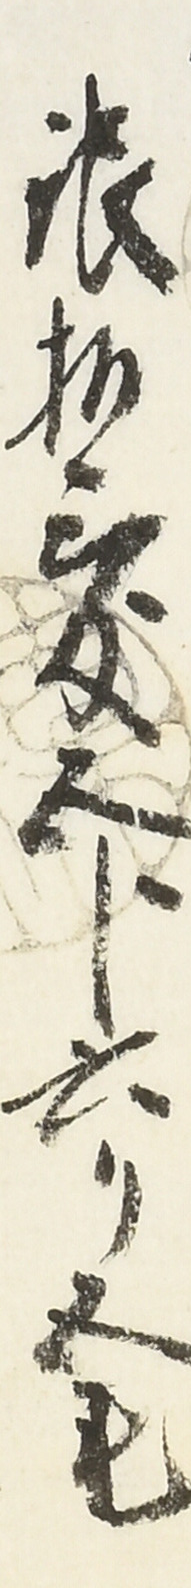銀拾三匁五分六厘五毛
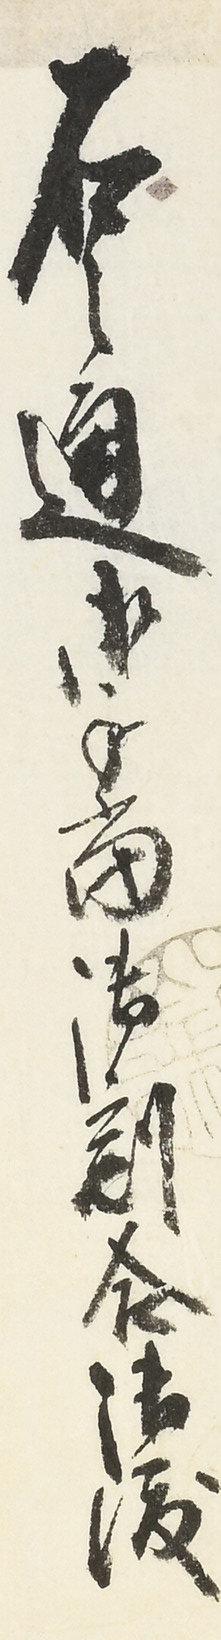右之通御手当御割合御渡

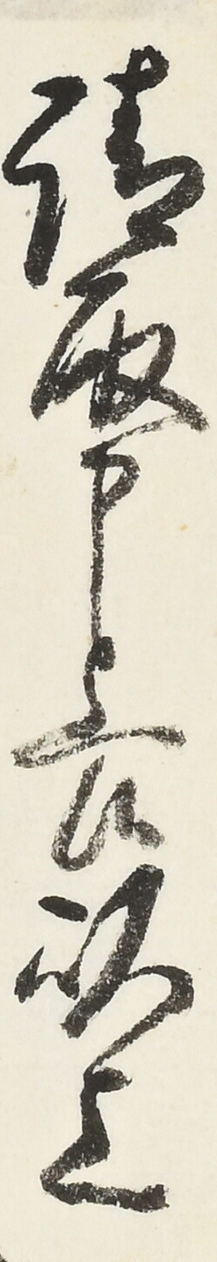請取申上候以上
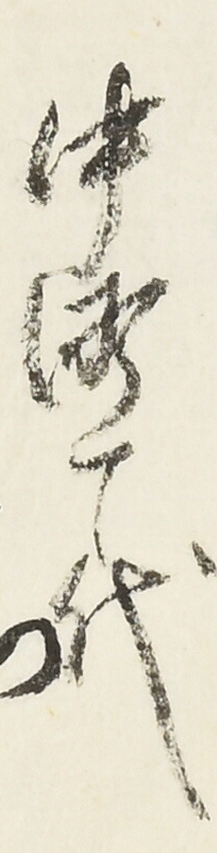中町丁代
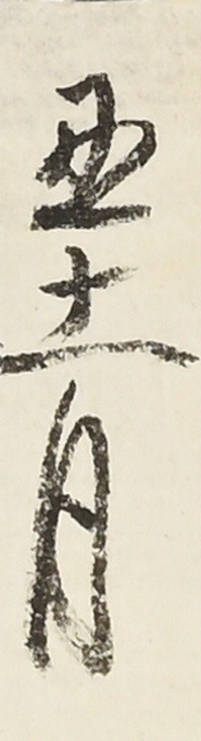丑十一月
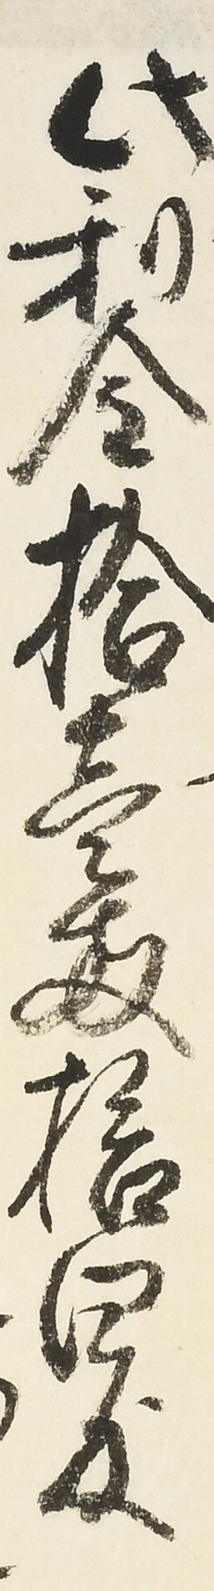此利金拾壱両拾四匁
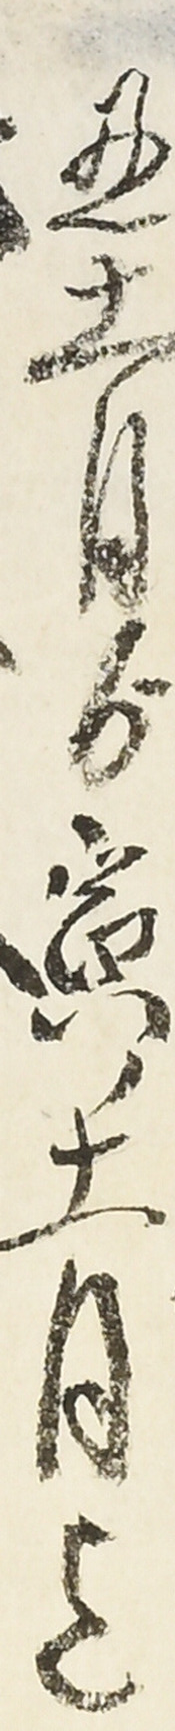丑十一月ゟ寅ノ十一月迄
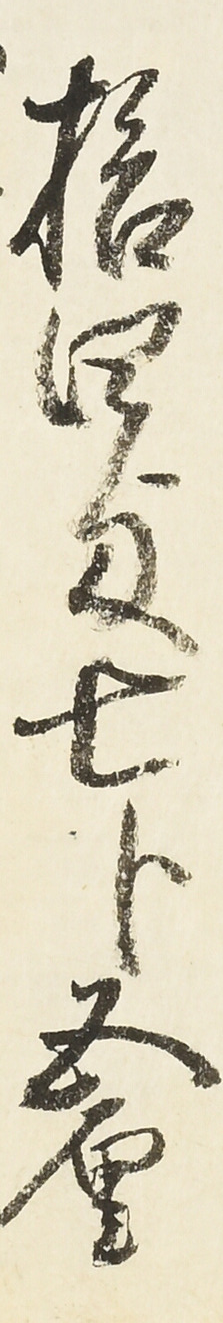拾四匁七分五厘
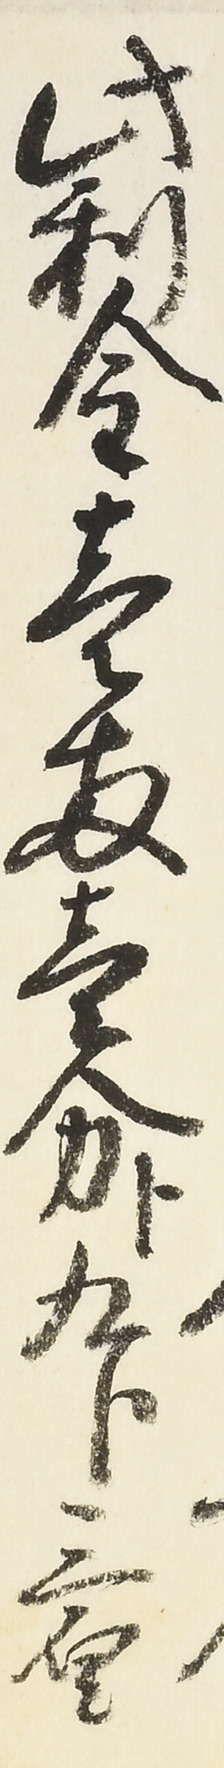此利金壱両壱分ト九分三厘
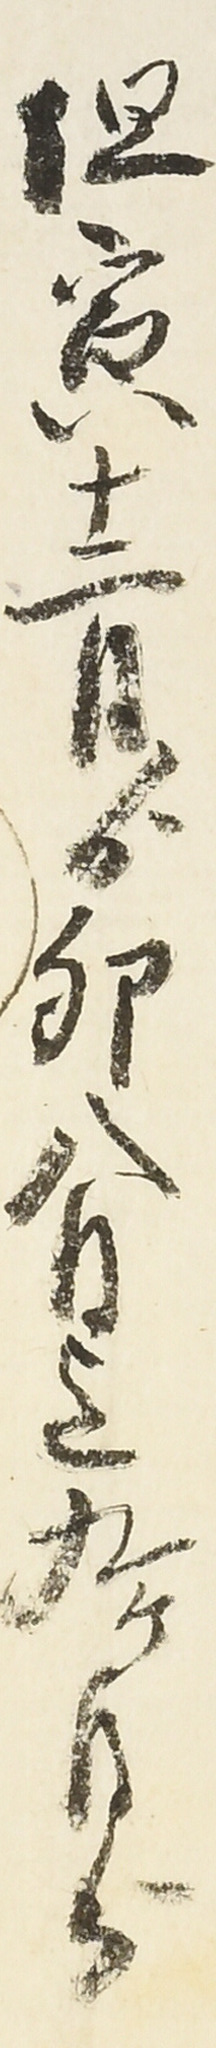但寅十二月ゟ卯八月迄九ヶ月分
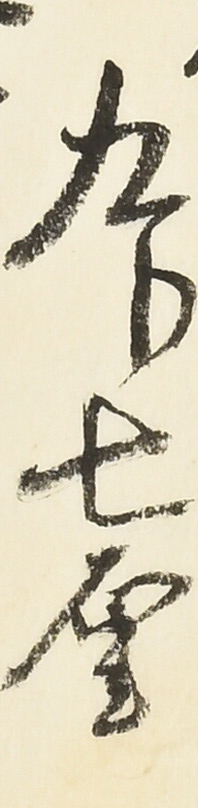九分七厘
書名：御才覚金御利足割渡扣帳
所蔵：伊那市立高遠町図書館・合同会社AMANE
